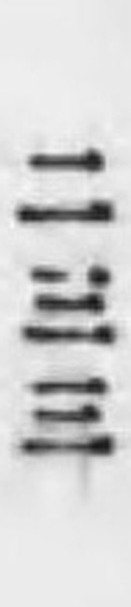二三三

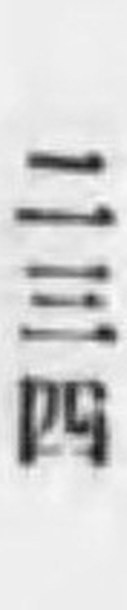二三四
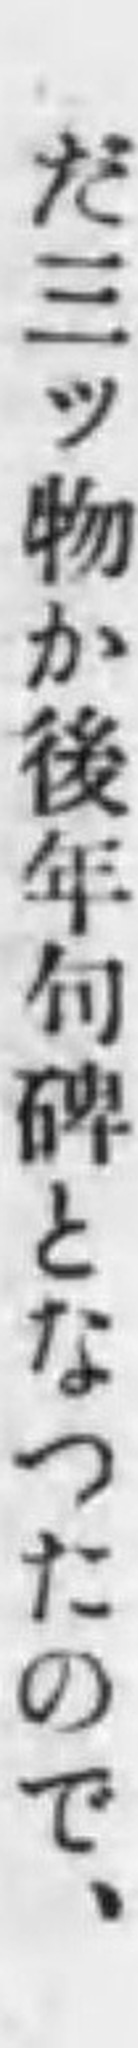だ三ッ物か後年句碑となつたので、
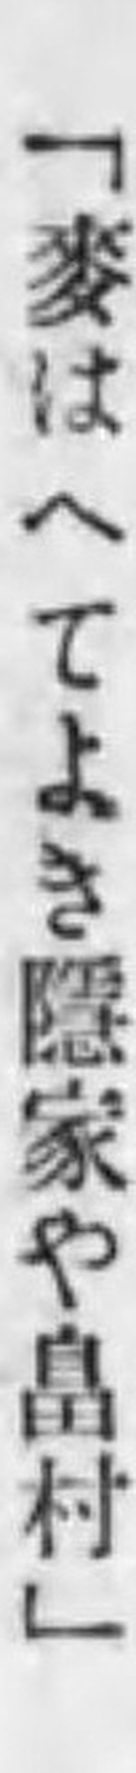「麦はへてよき隠家や畠村」芭蕉
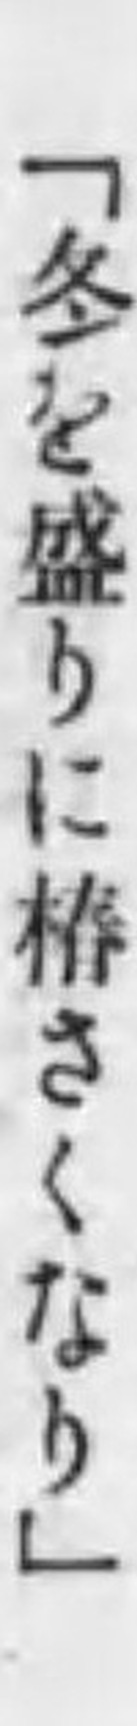「冬を盛りに椿さくなり」越人
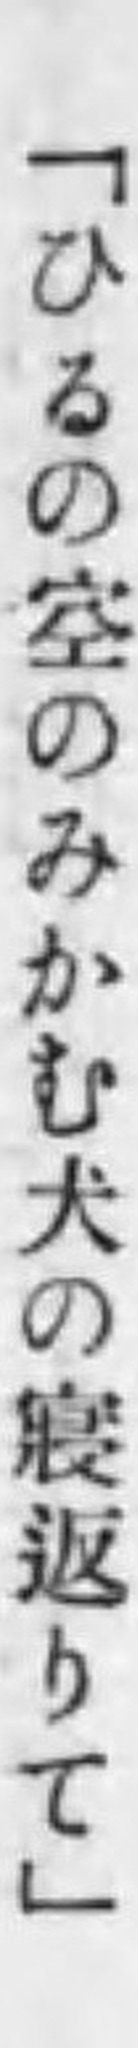「ひるの空のみかむ犬の寝返りて」野仁
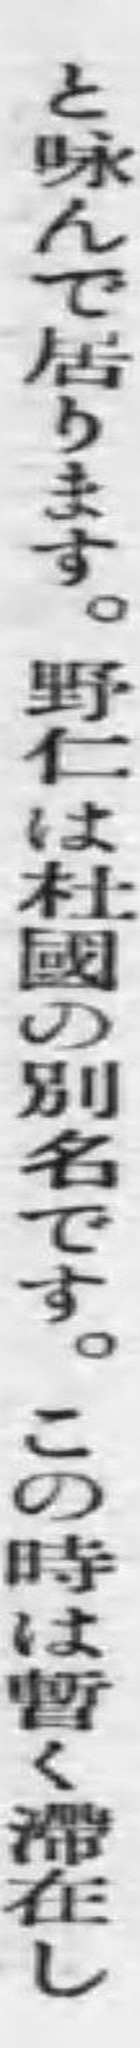と咏んで居ります。野仁は杜国の別名です。この時は暫く滞在し
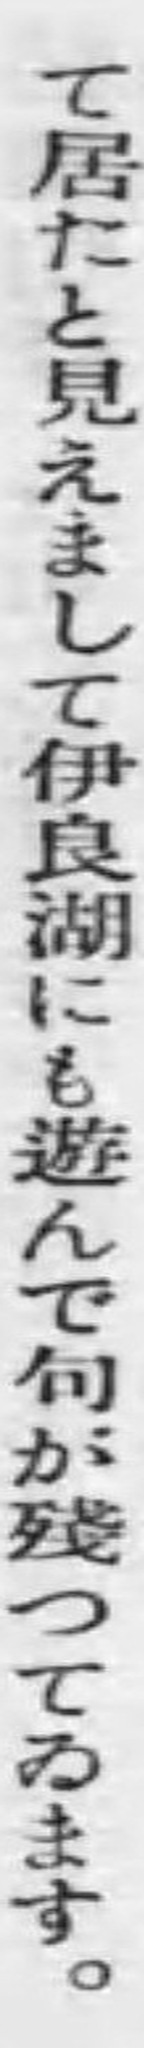て居たと見えまして伊良湖にも遊んで句が残つてゐます。
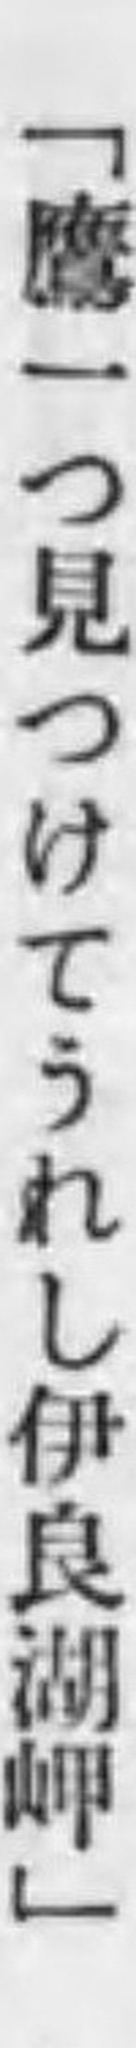「鷹一つ見つけてうれし伊良湖岬」
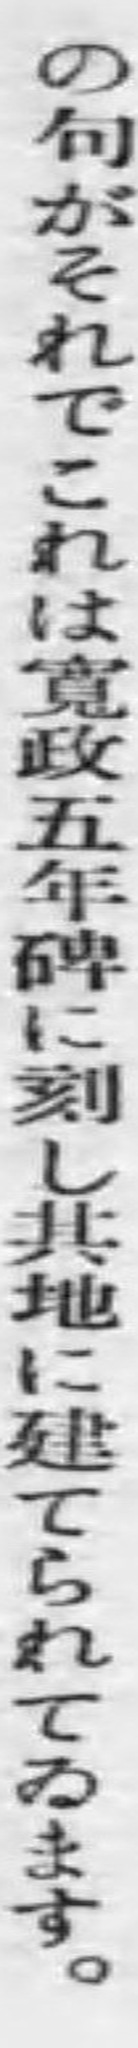の句がそれでこれは寛政五年碑に刻し其地に建てられてゐます。
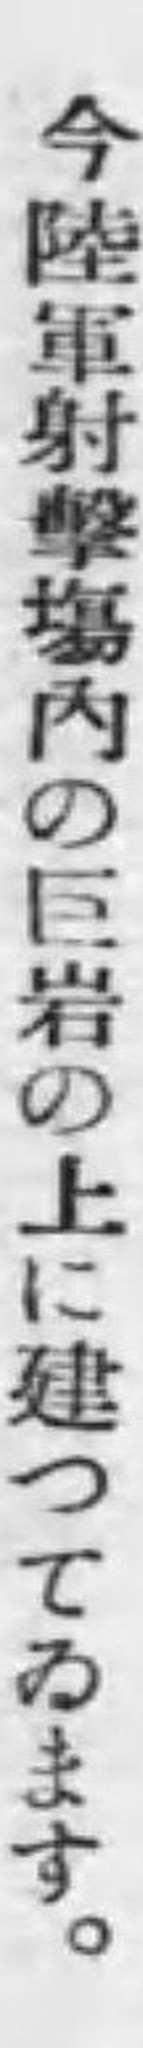今陸軍射撃場内の巨岩の上に建つてゐます。
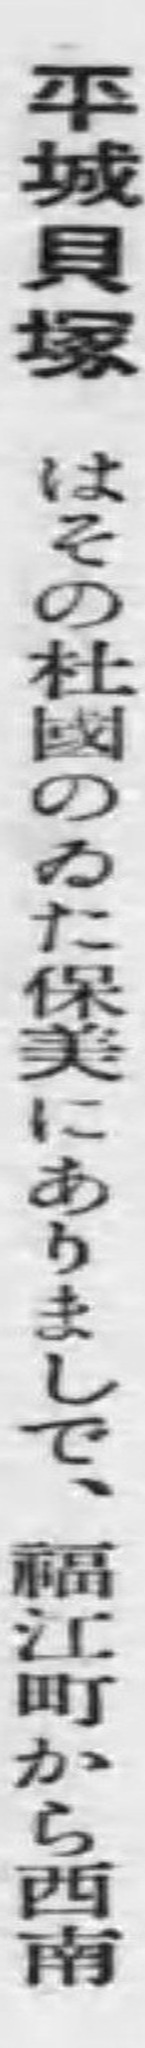平城貝塚はその杜国のゐた保美にありましで、福江町から西南
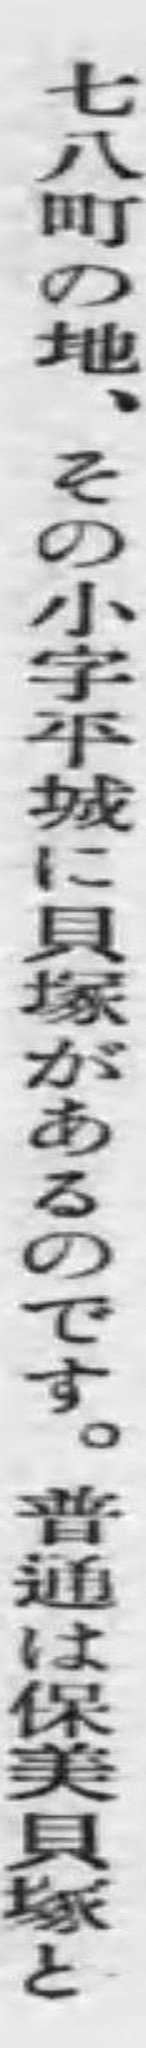七八町の地、その小字平城に貝塚があるのです。普通は保美貝塚と
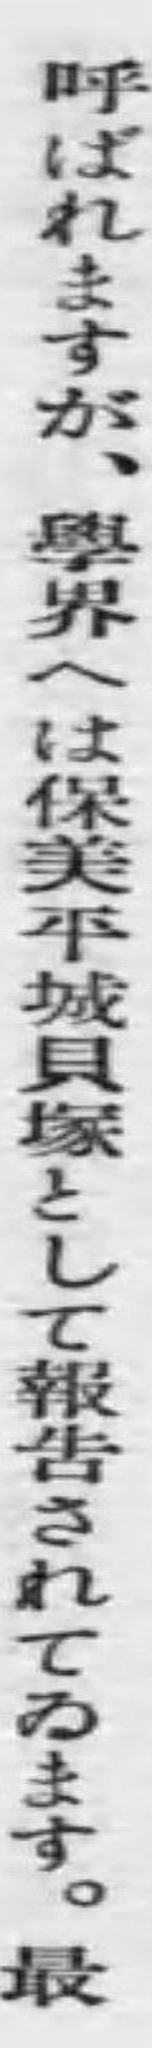呼ばれますが、学界へは保美平城貝塚として報告されてゐます。最
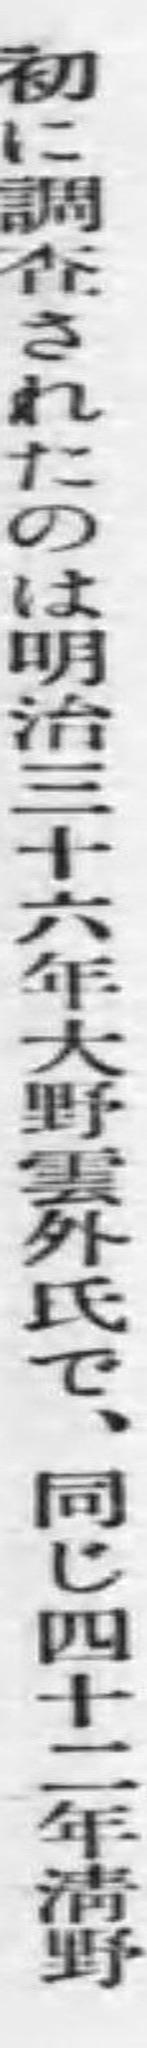初に調査されたのは明治三十六年大野雲外氏で、同じ四十二年清野
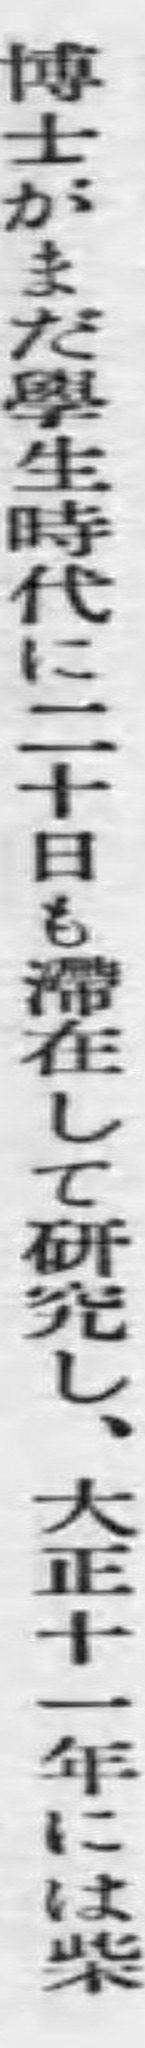博士がまだ学生時代に二十日も滞在して研究し、大正十一年には柴
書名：東三河道中記 : 豊橋市及其附近案内
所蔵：国立国会図書館 National Diet Library, JAPAN
